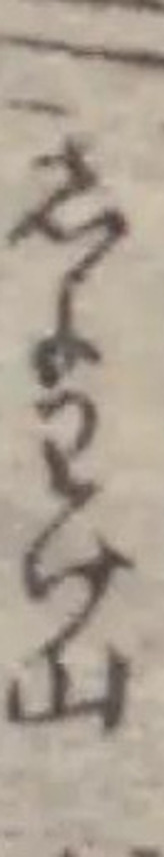しよわけ山
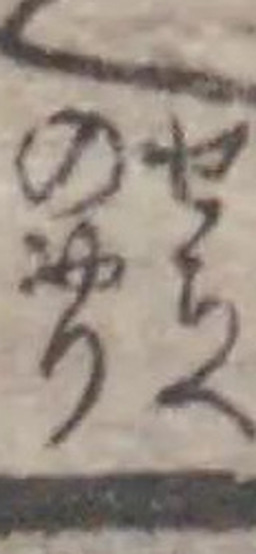のおり
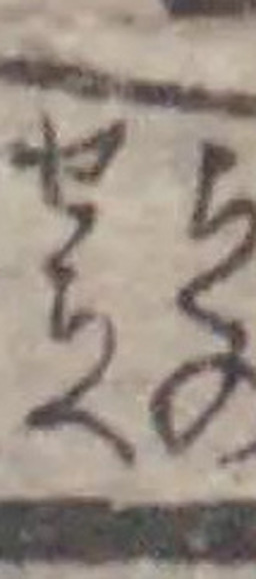せちへ
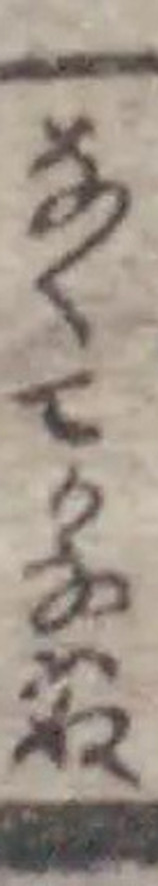なくてかなはぬ
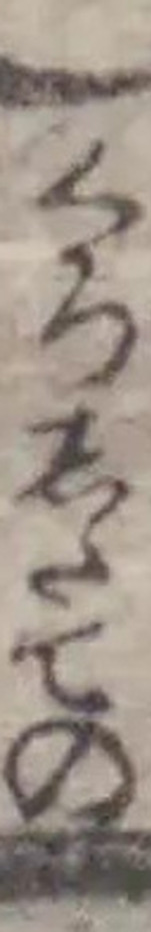くろしたての
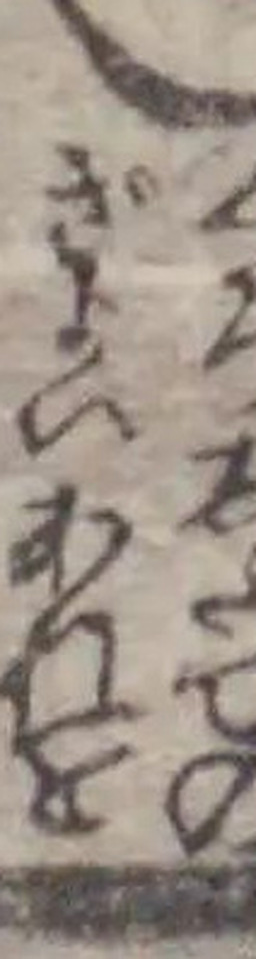ぎよいあれを
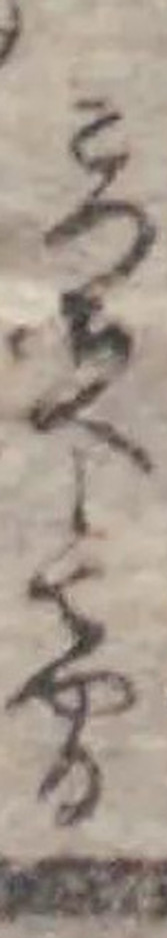こつちへしてやる
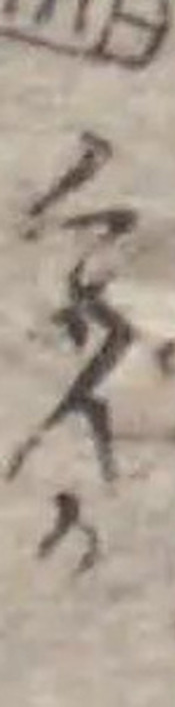くめんか
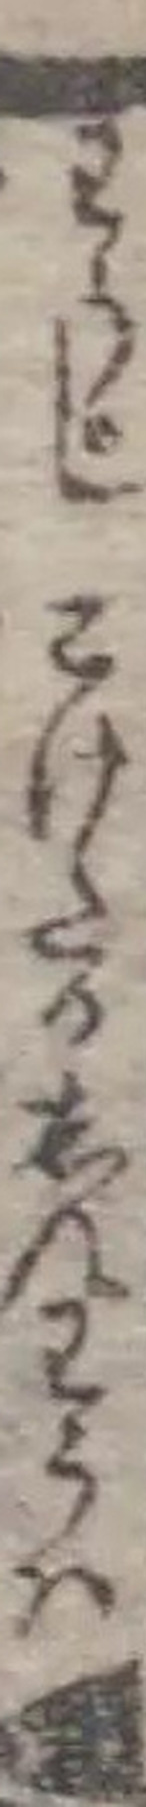わうじこけたかしんわうは
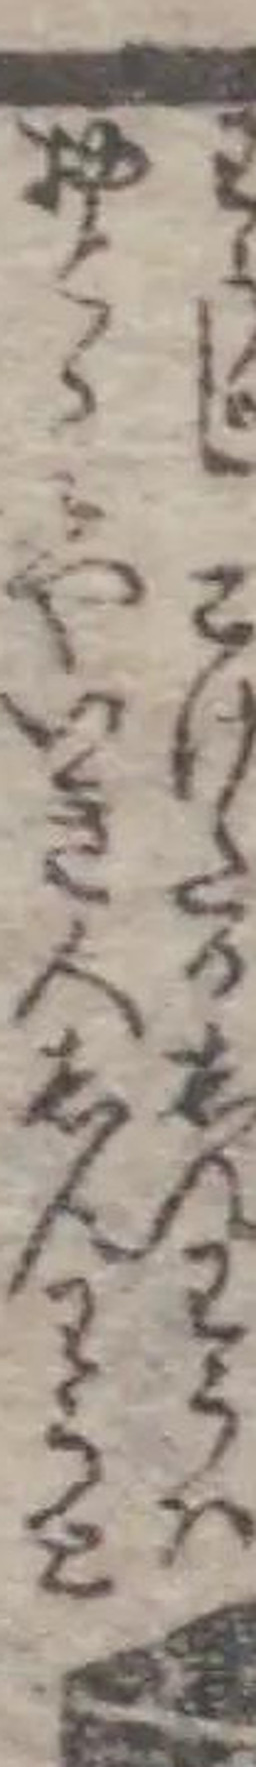おとゝみやいき人しんわうと
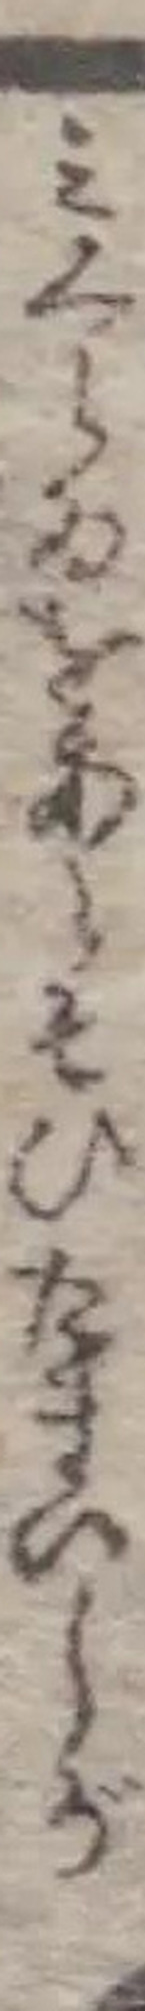みくらゐをあらそひたまいしが
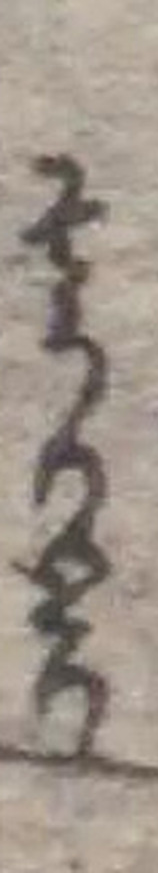そうりとり
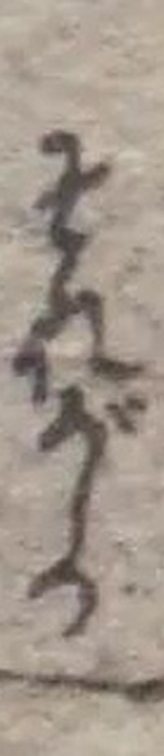それがしか
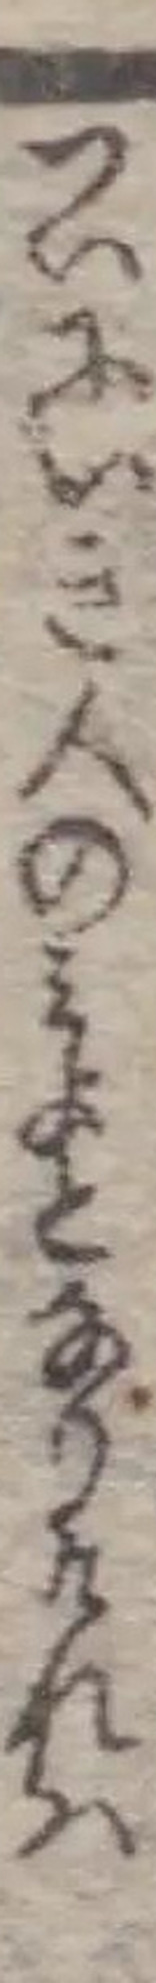ついにいき人のみよとなりければ
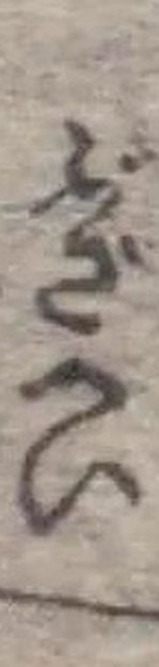ぶざへい
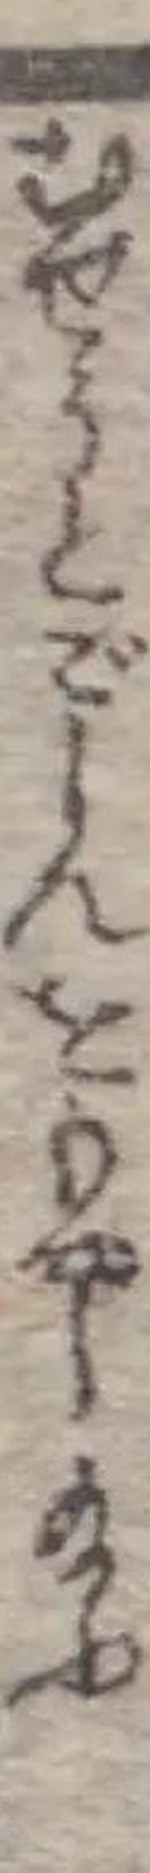むせうとごしんをもやし給ふ
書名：富多高慢噺 3巻
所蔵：国立国会図書館 National Diet Library, JAPAN
